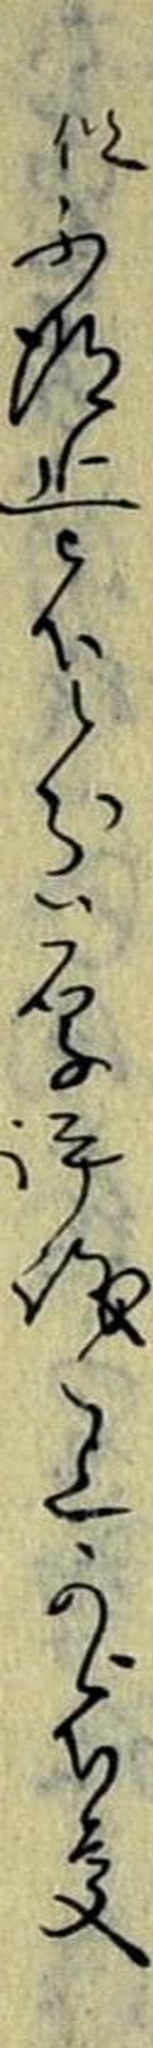但不得止被下候分は厚評議之上可被下事
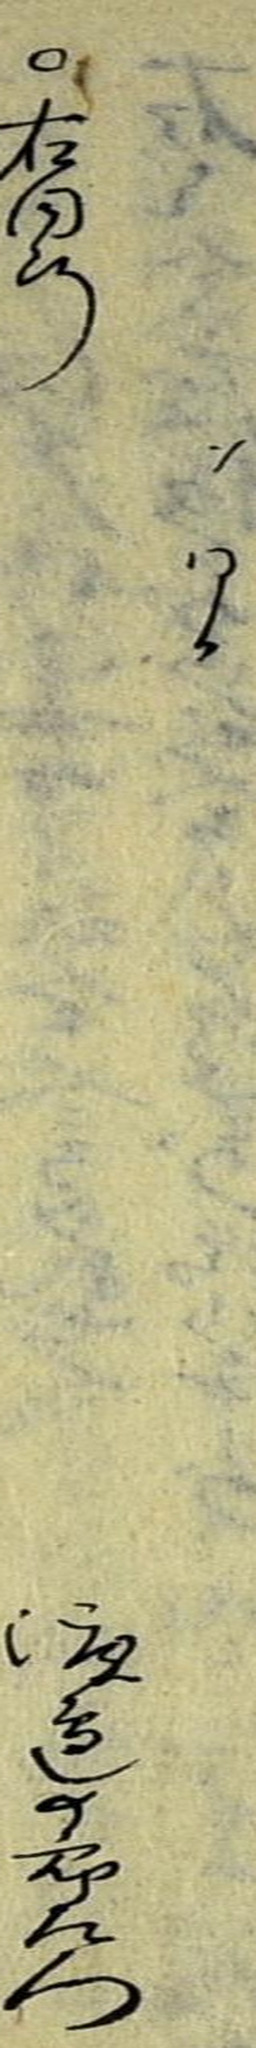〇右同断渡辺十郎左衛門
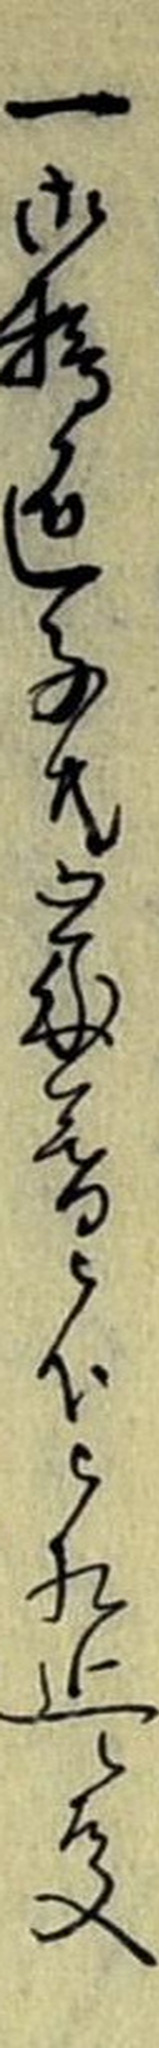一御鵜匠子共歳暮被下被相止候事
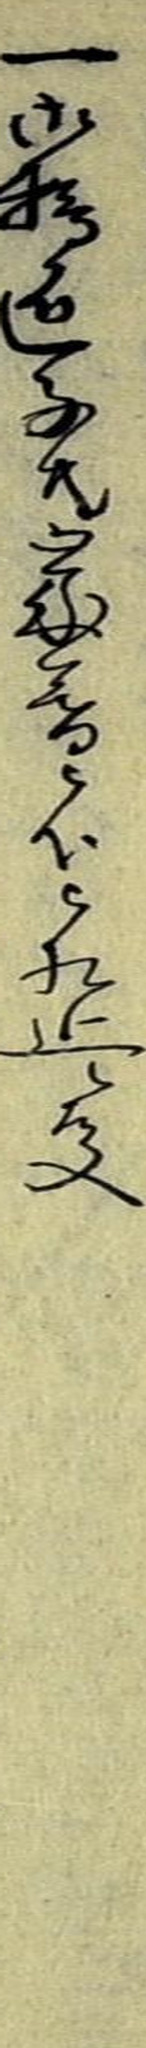一御鵜匠子共歳暮被下被相止候事
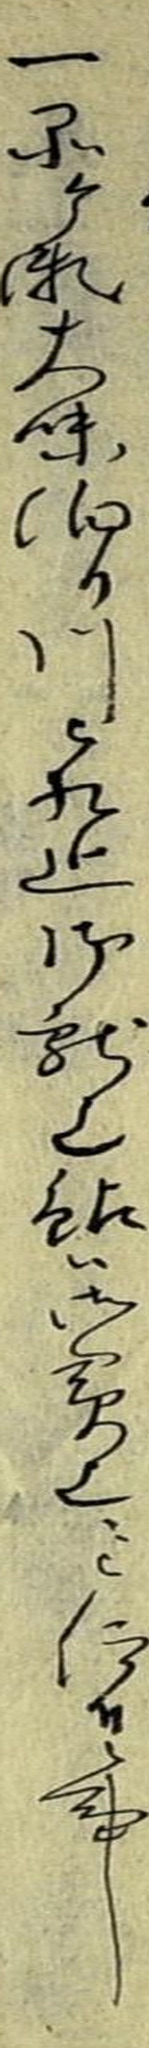一品ヶ瀬大味泊り川被相止御献上鮎は御買上に被仰付候事
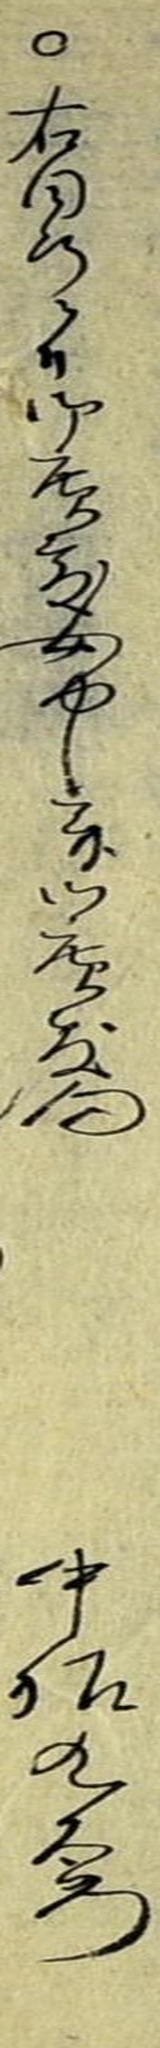〇右同断に付御広敷女中并御広敷向中根九右衛門
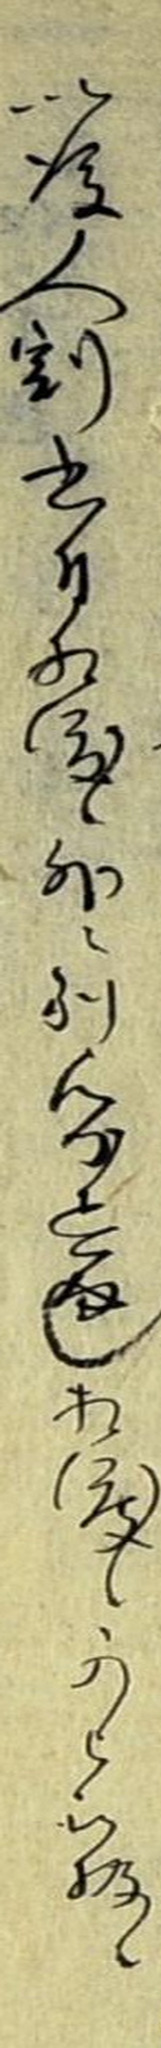以後人割書付相渡候外に別紙壱通相渡候可被取扱候
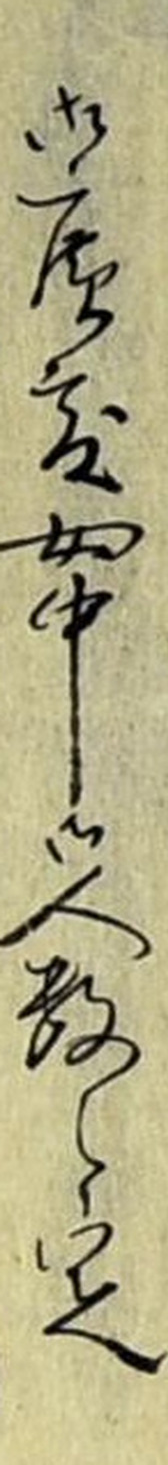御広敷女中御人数之定
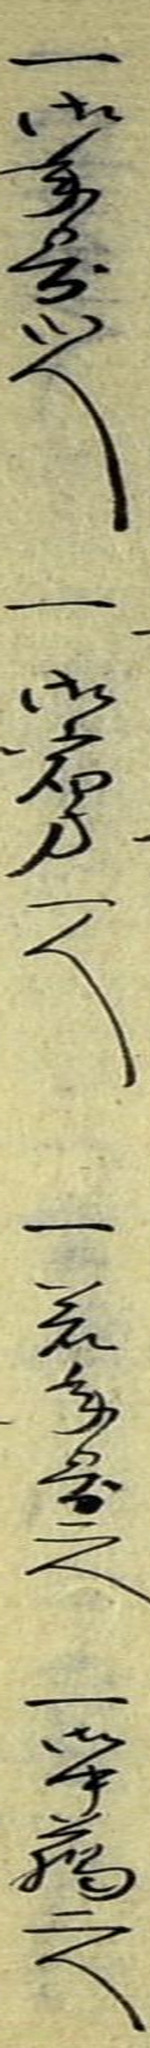一御年寄弐人一御宿方一人一若年寄二人一御中臈二人
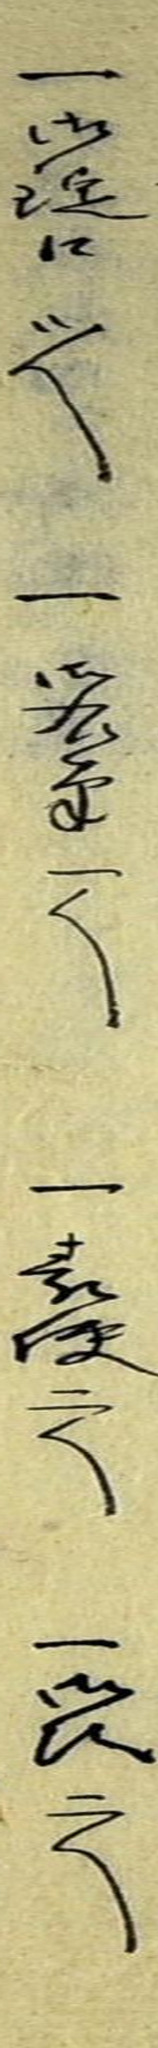一御錠口弐人一御右筆一人一表使二人一御次二人
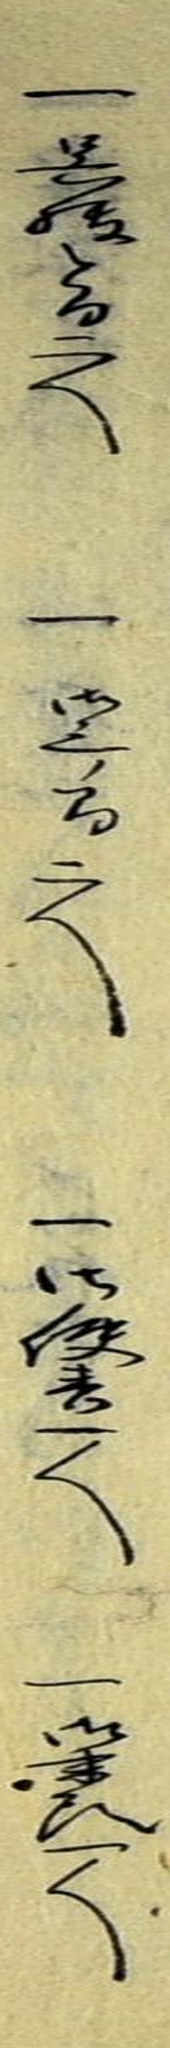一呉服之間二人一御三ノ間二人一御使番一人一御末頭一人

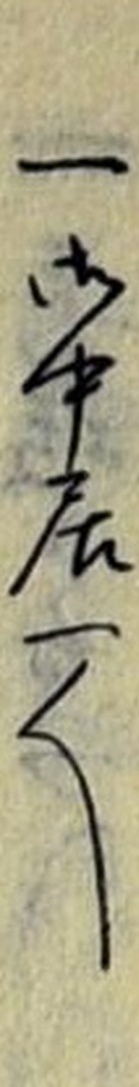一御使番一人
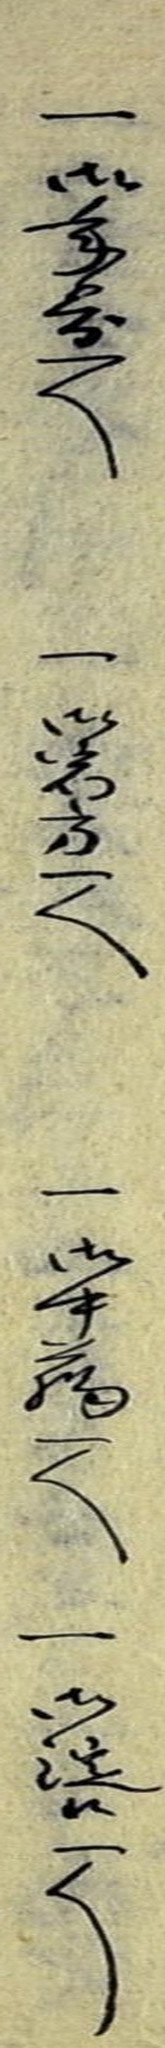一御年寄一人一御宿方一人一御中臈一人一御錠口一人
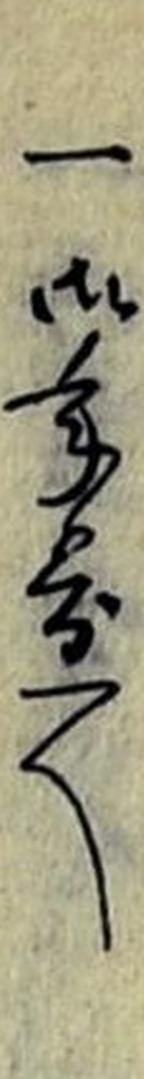一御使番一人
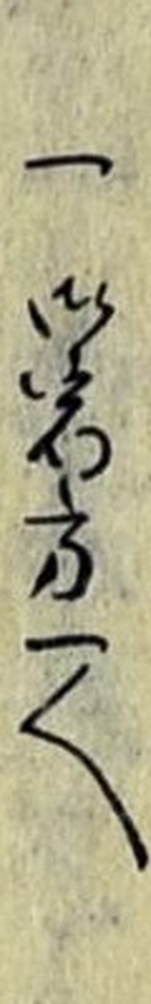一御使番一人
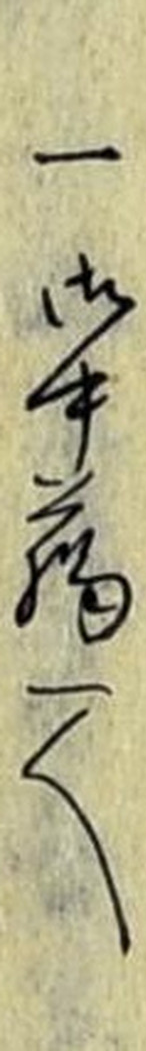一御使番一人
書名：命令之部 二
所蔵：福井県文書館 Fukui Prefectural Archives
